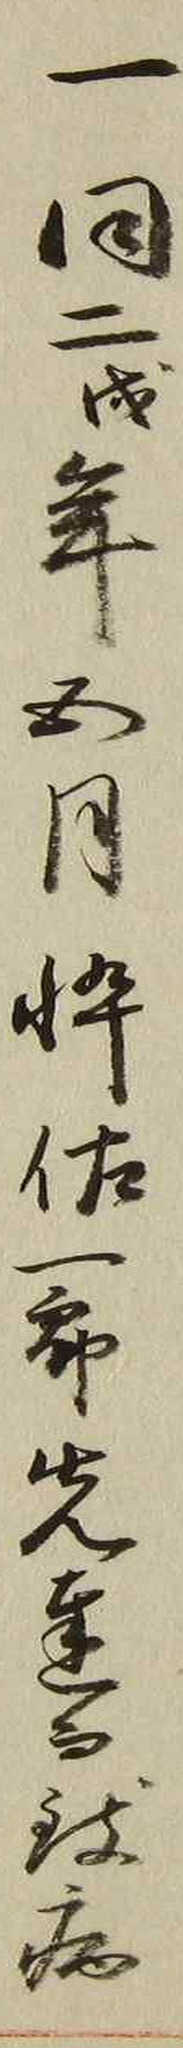一同二戌年五月忰佐一郎先達而致病
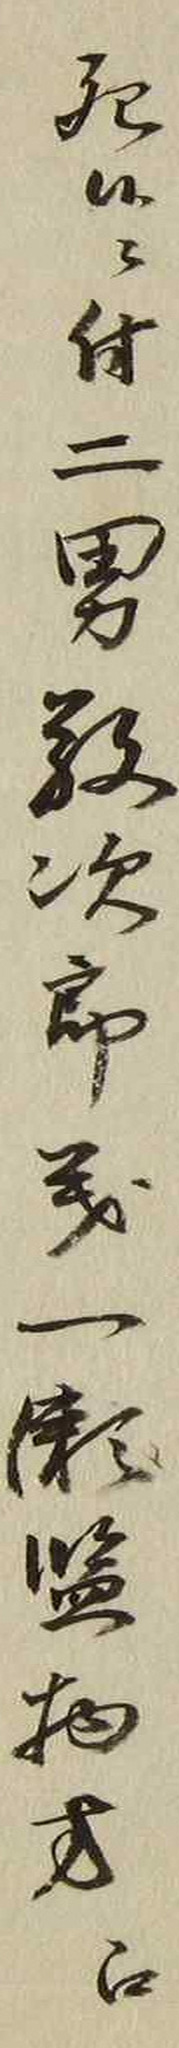死候に付二男敬次郎義一瀬監物方江
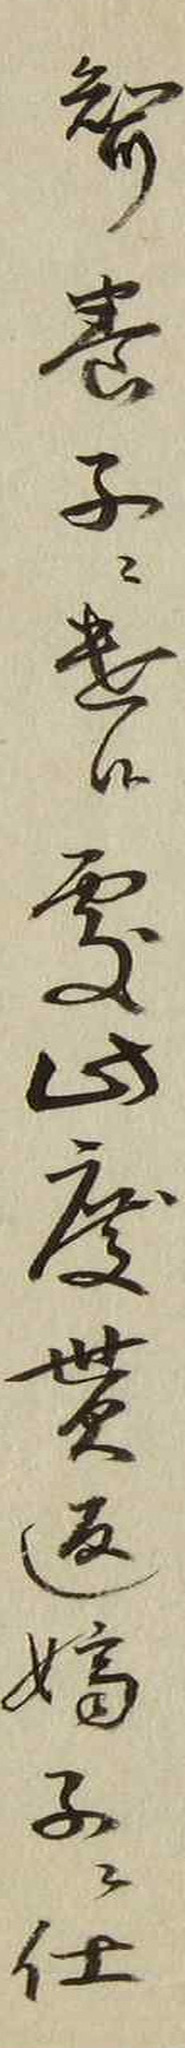聟養子に遣候処此度貰返嫡子に仕
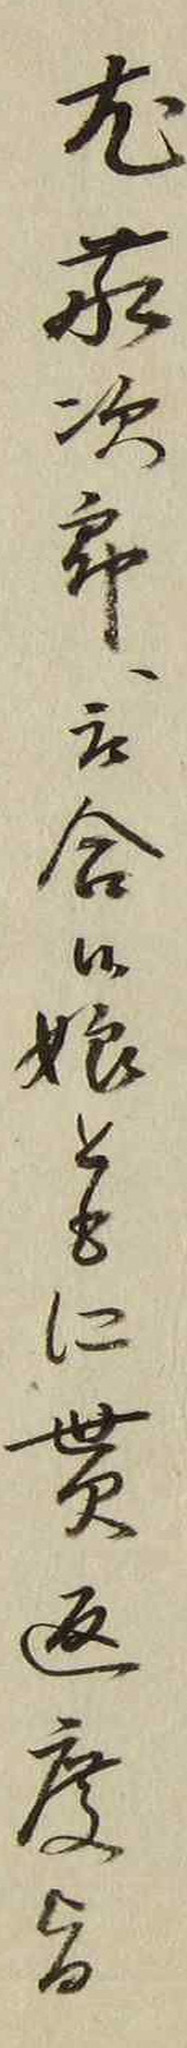尤慶次郎に取合候娘ともに貰返度旨
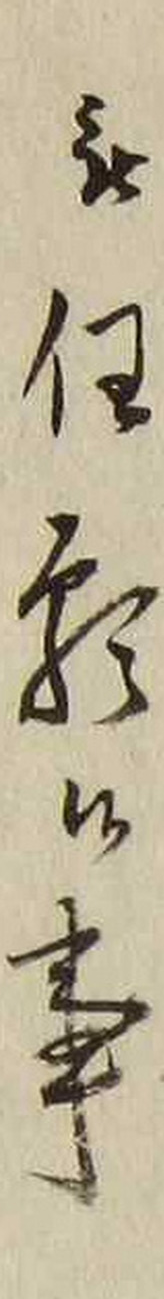被任願候事
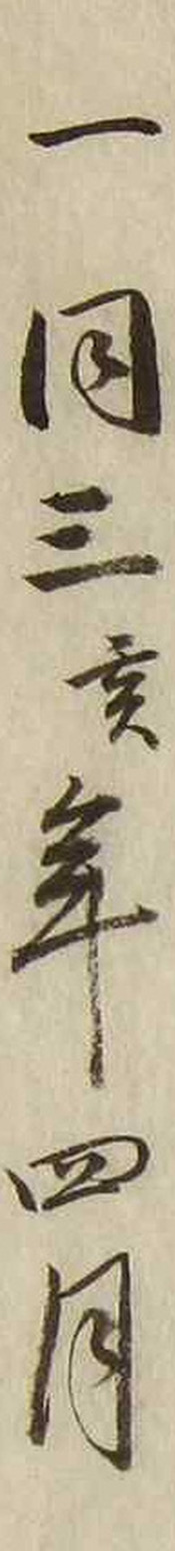一同三亥年四月

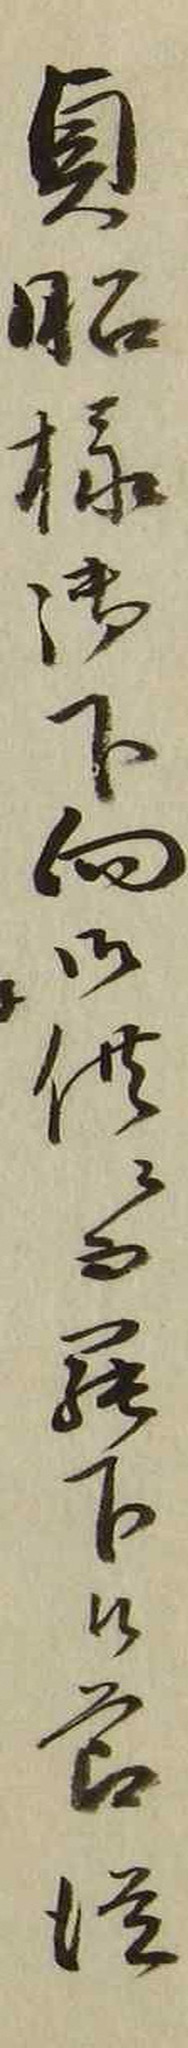貞昭様御下向御供に而罷下候節従
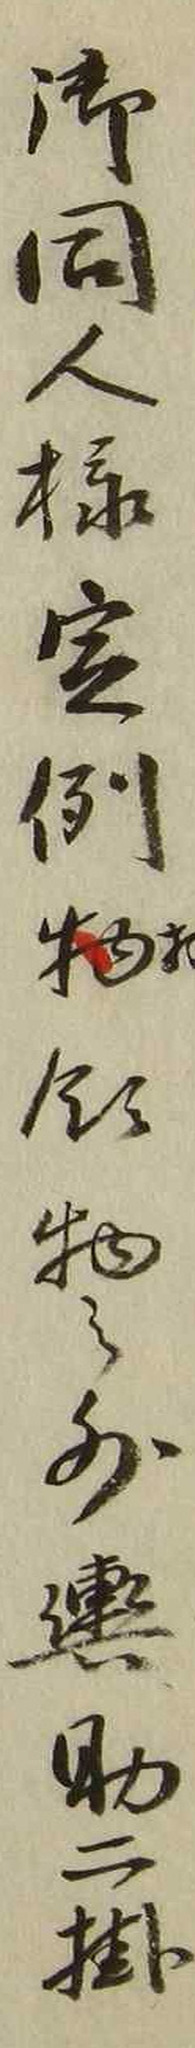御同人様定例物領物之外輿助二掛
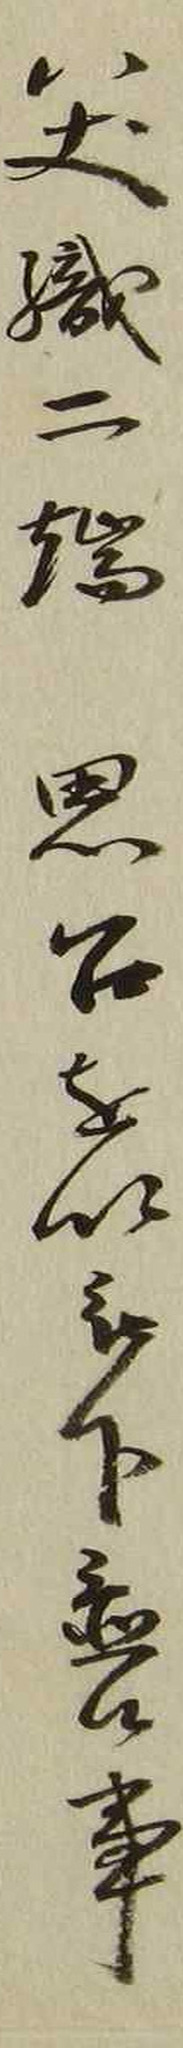八丈織二端思召を以被下置候事
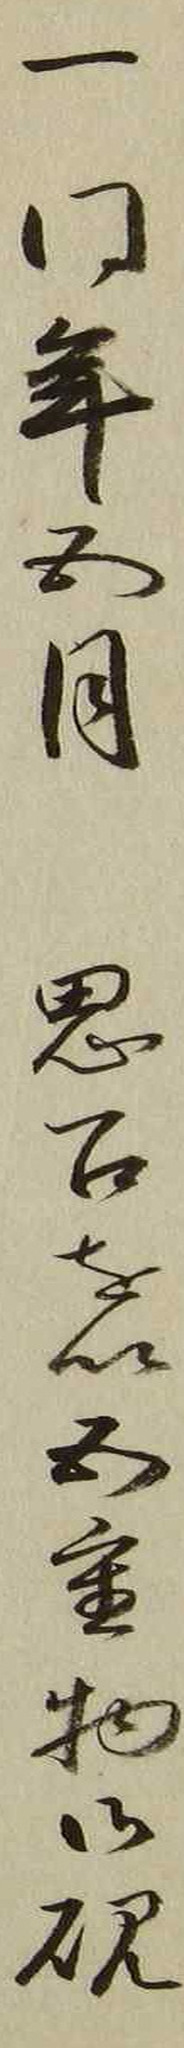一同年五月思召を以五重物御硯
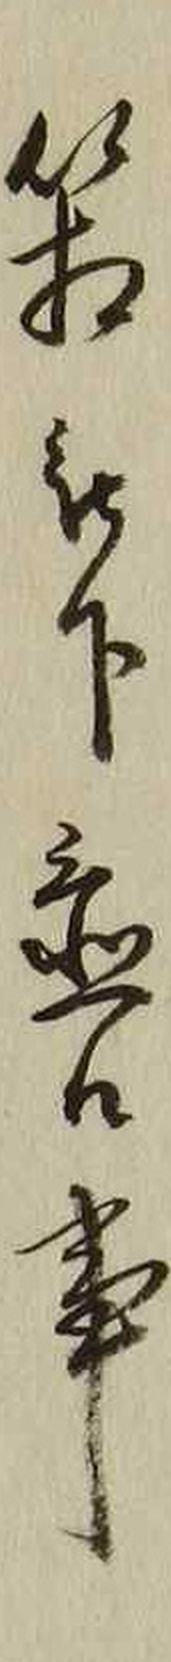箱被下置候事
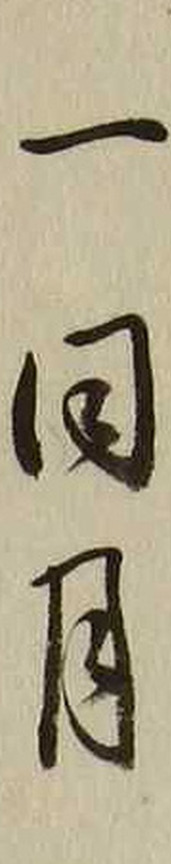一同月
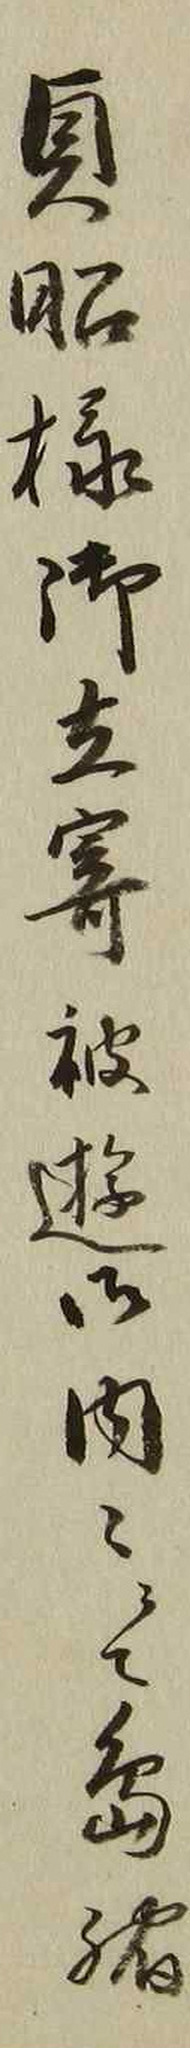貞昭様御立寄被遊御内々にて島縮
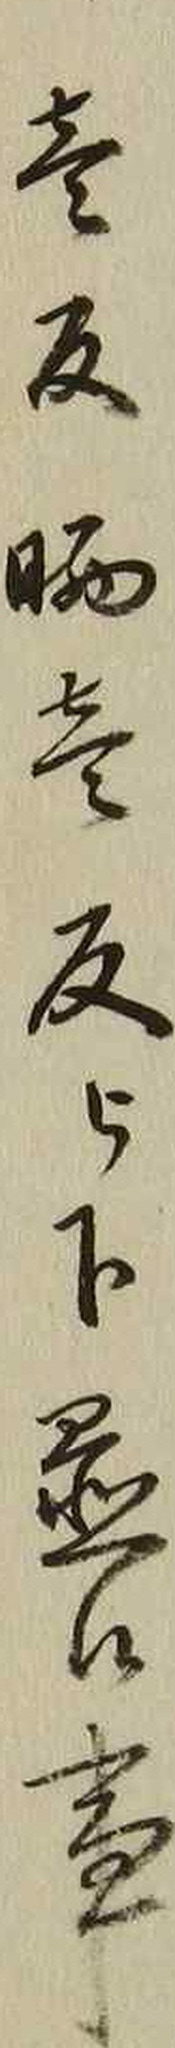壱反晒壱反被下置候事
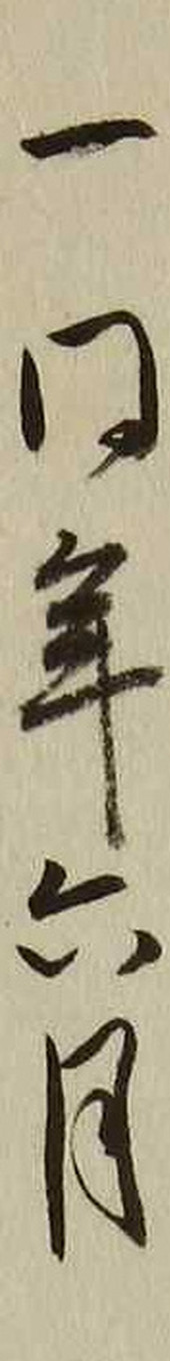一同年六月
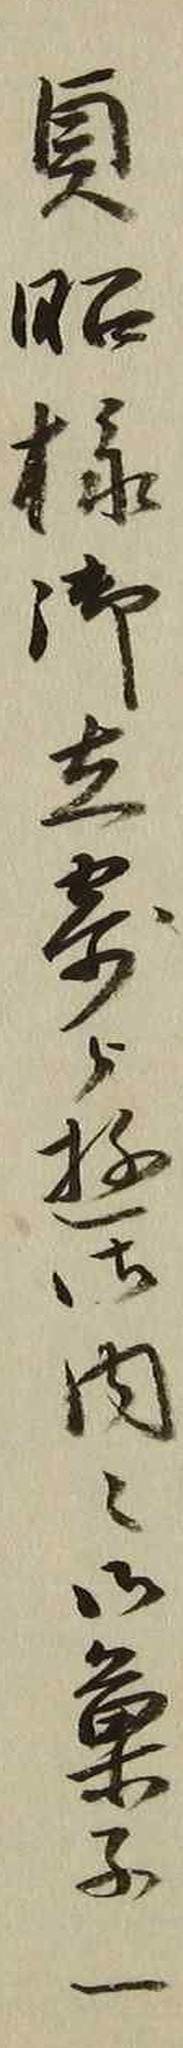貞昭様御立寄被遊御内々御菓子一
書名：諸士系譜　巻之125　た之部1
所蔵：会津若松市立会津図書館
